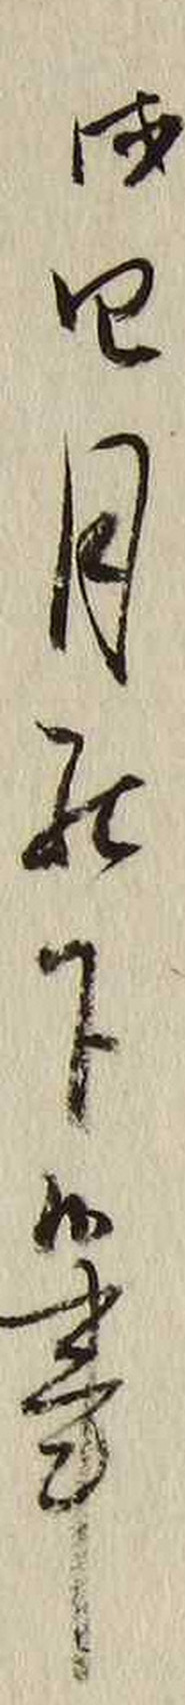戊四月罷下候事
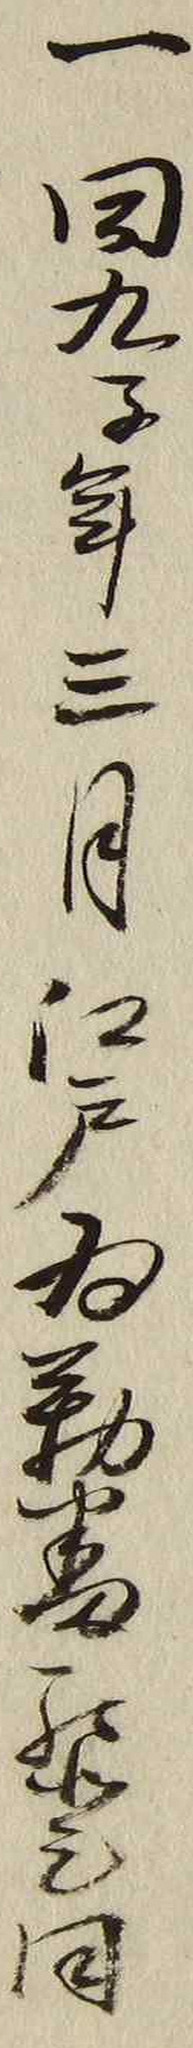一同九子年三月江戸為勤番罷登同
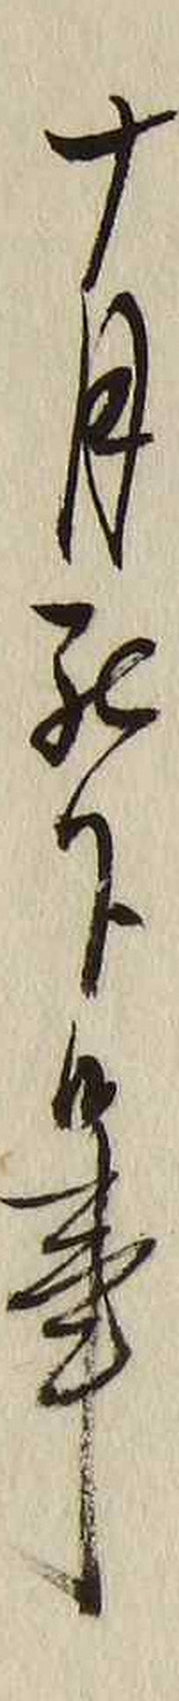十月罷下候事

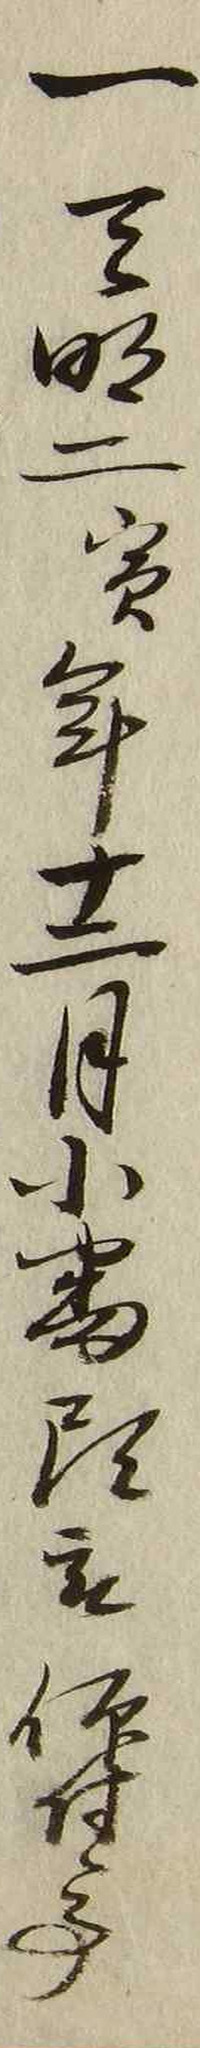一天明二寅年十二月小番頭被仰付候事
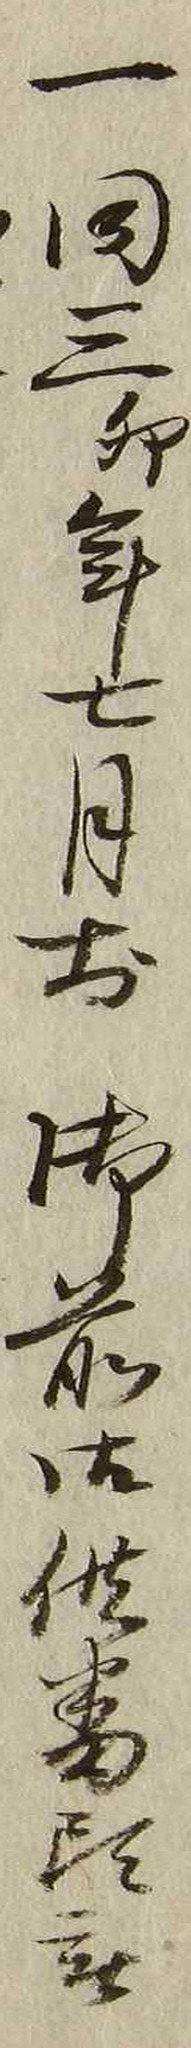一同三卯年七月於御前御供番頭被
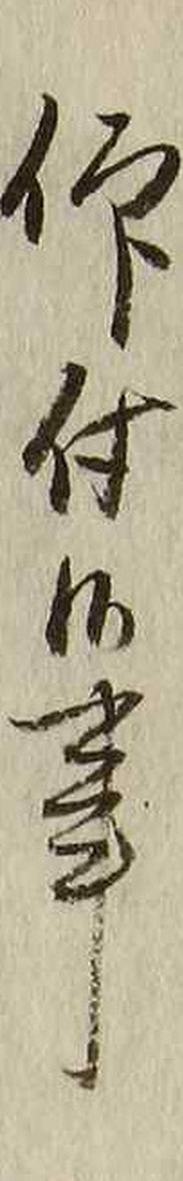仰付候事
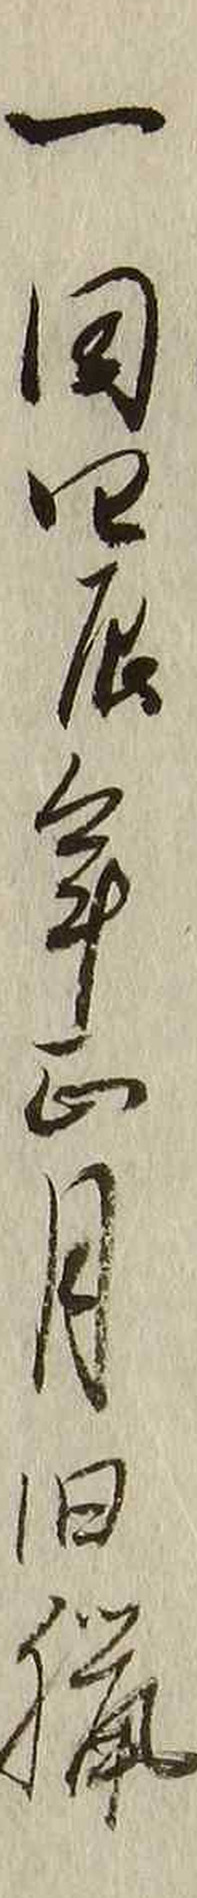一同四辰年正月旧臘
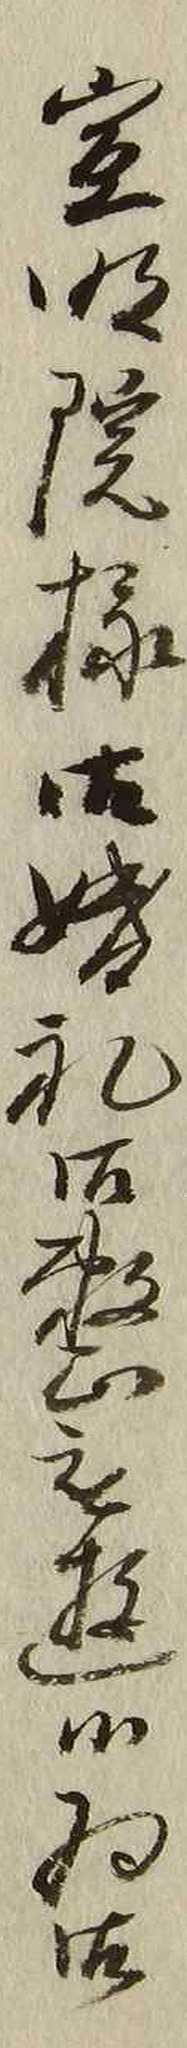宣明院様御婚礼御整被遊候為御
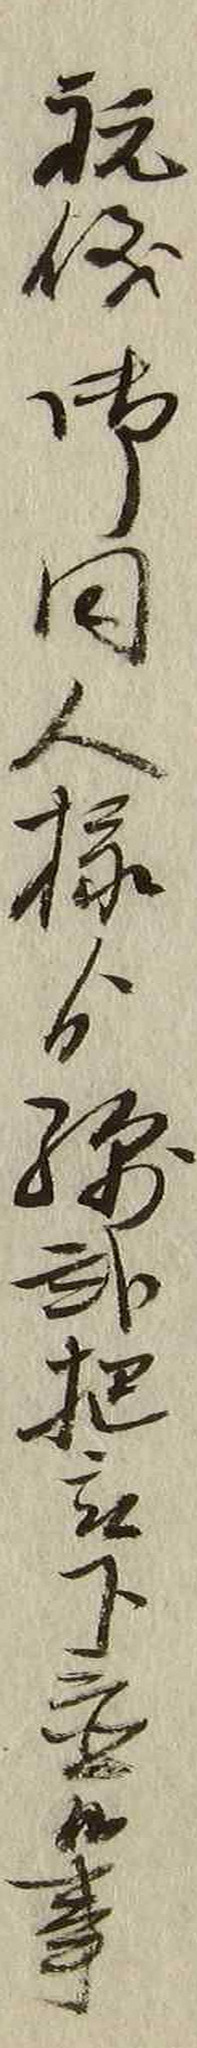祝儀御同人様ゟ綿弐把被下置候事
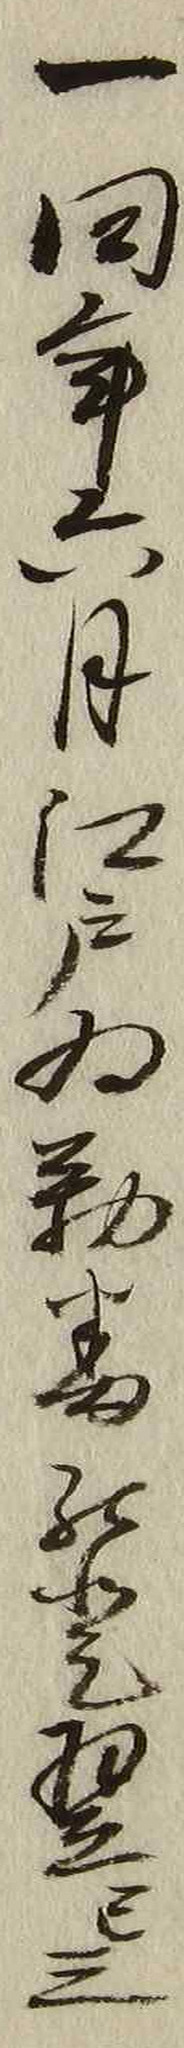一同年六月江戸為勤番罷登翌巳三
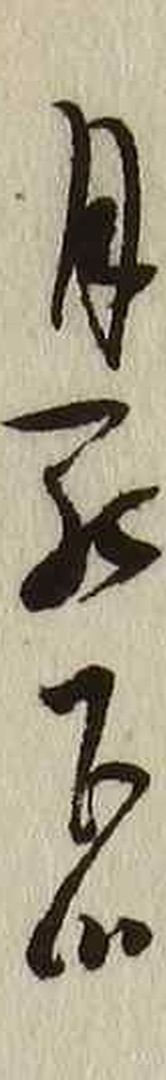月罷下候
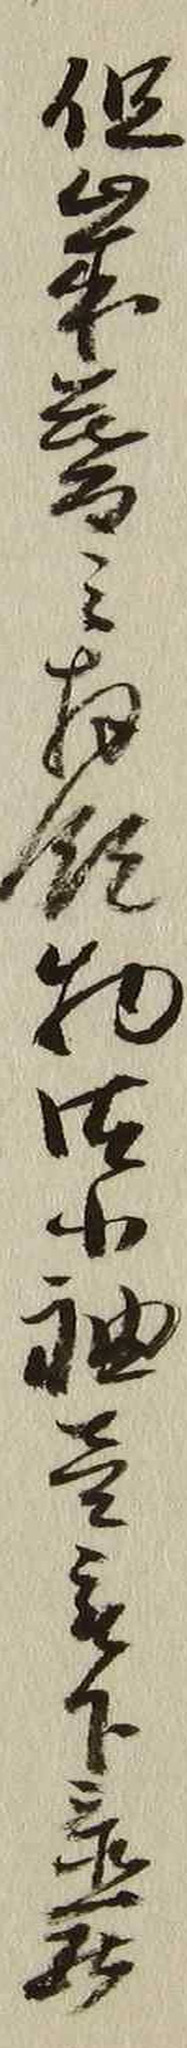但歳暮之拝領物御小袖壱被下置罷
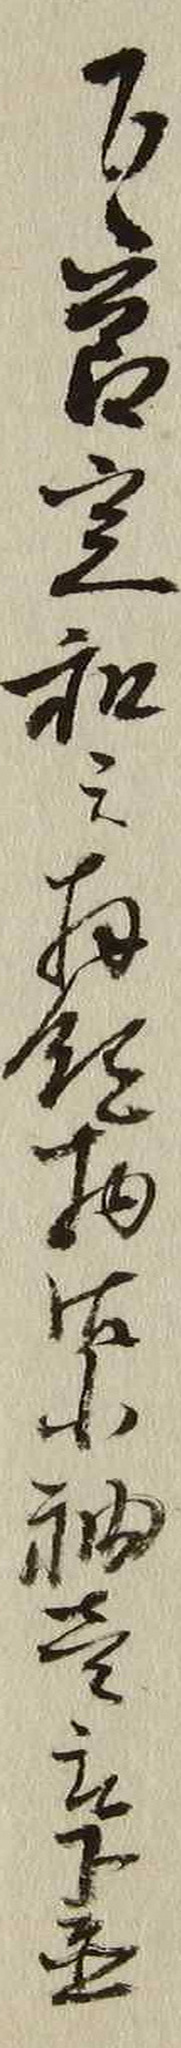下候節定和之拝領物御小袖壱被下置
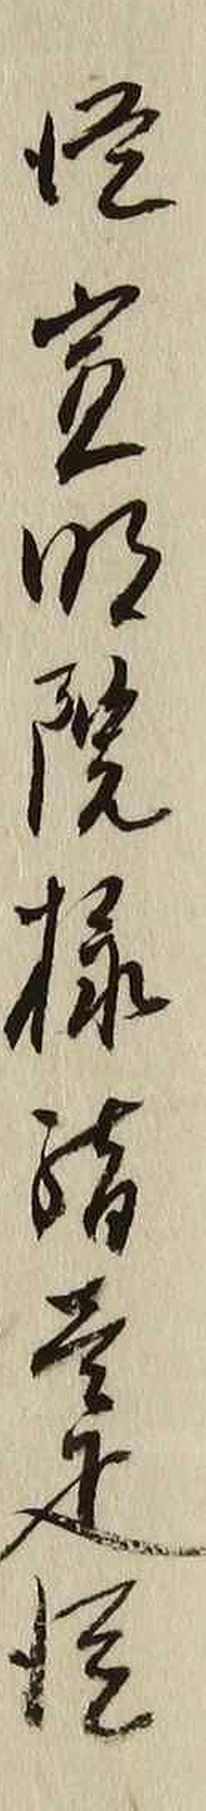従宣明院様絹壱疋従
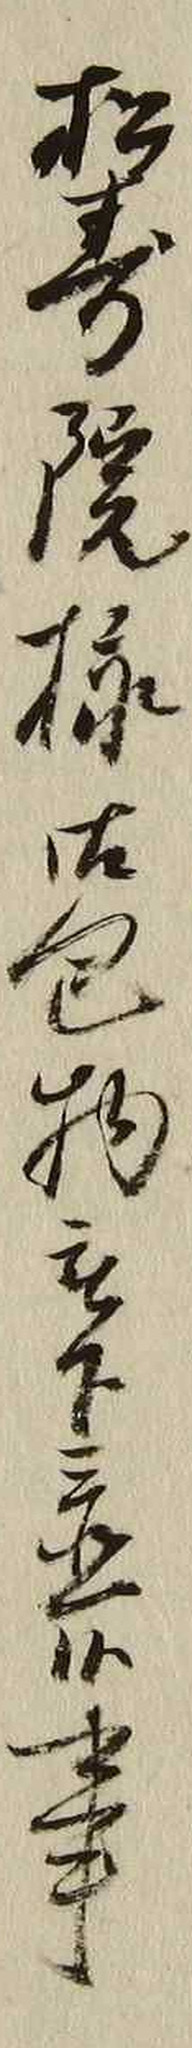松寿院様御包物被下置候事
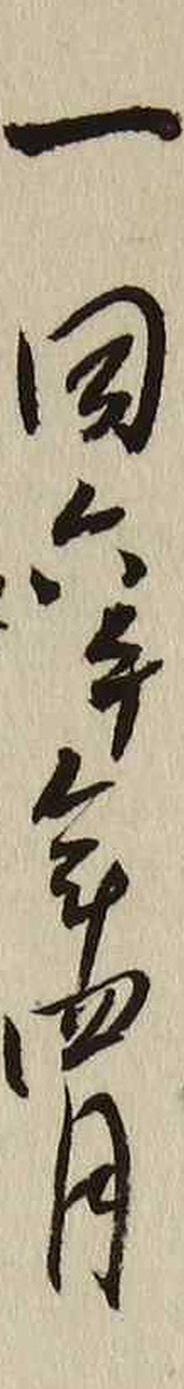一同六午年四月
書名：諸士系譜　巻之356　す之部6
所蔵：会津若松市立会津図書館
